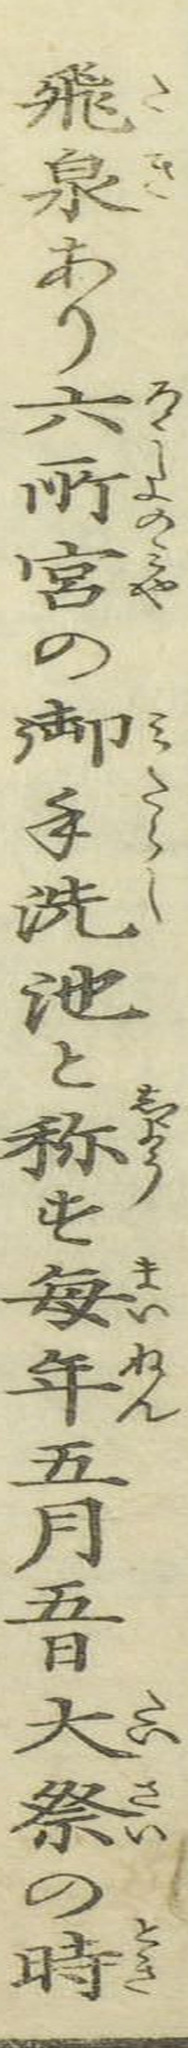飛泉あり六所宮の御手洗池と称す毎年五月五日大祭の時
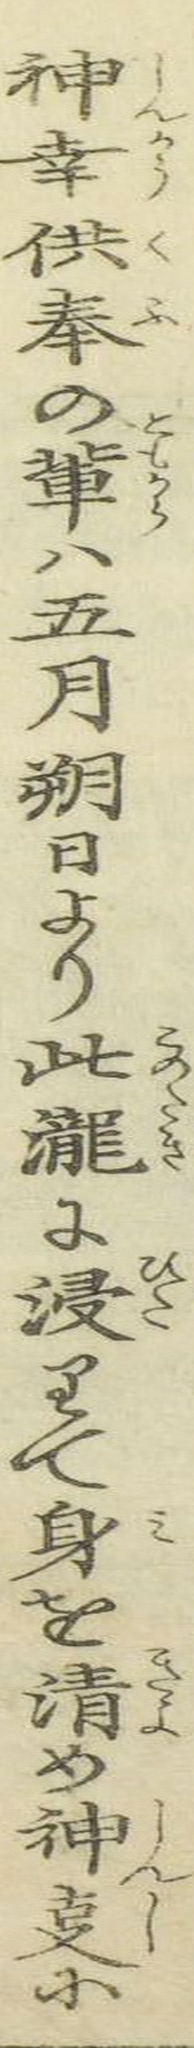神幸供奉の輩は五月朔日より此滝に浸りて身を清め神㕝に
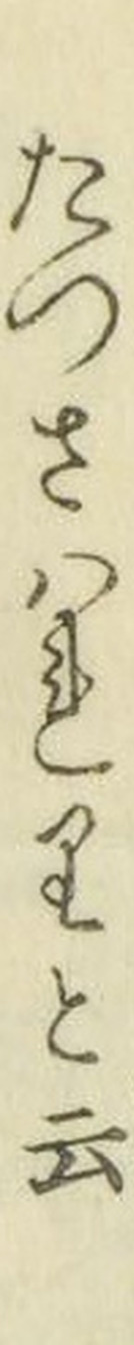たつさはれりと云
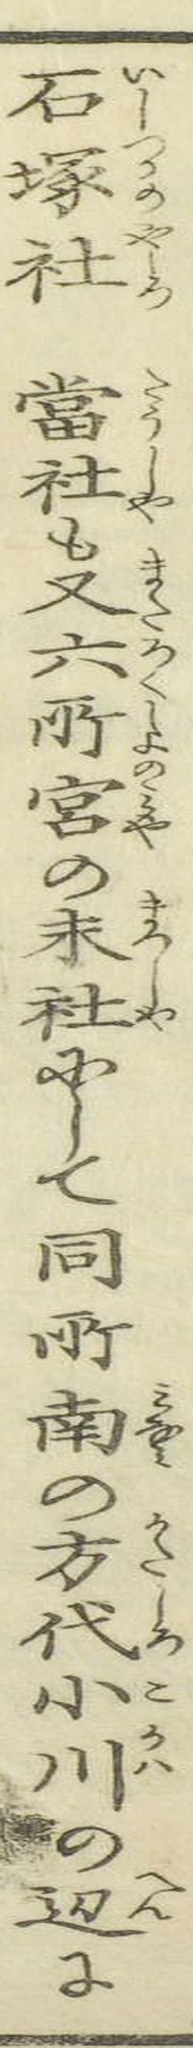石塚社当社も又六所宮の末社にして同所南の方代小川の辺に
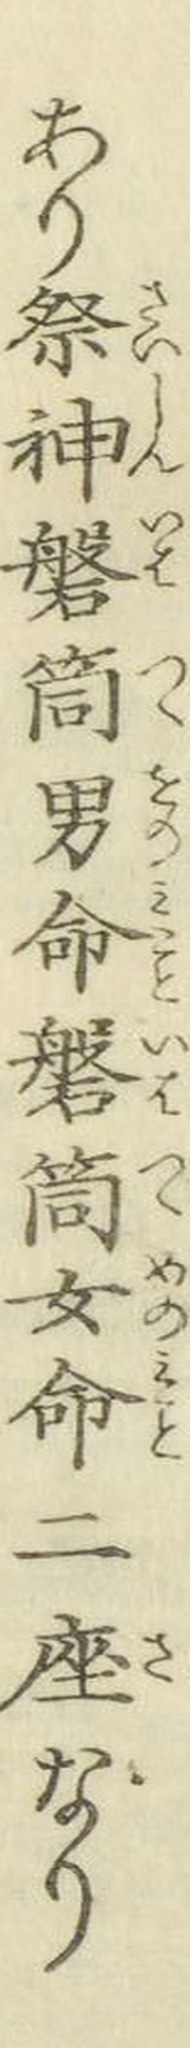あり祭神磐筒男命磐筒女命二座なり
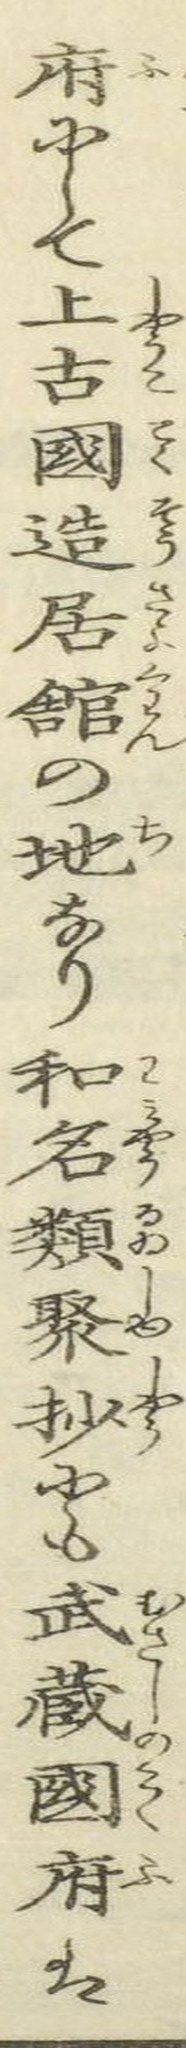府にして上古国造居館の地なり和名類聚抄にも武蔵国府は
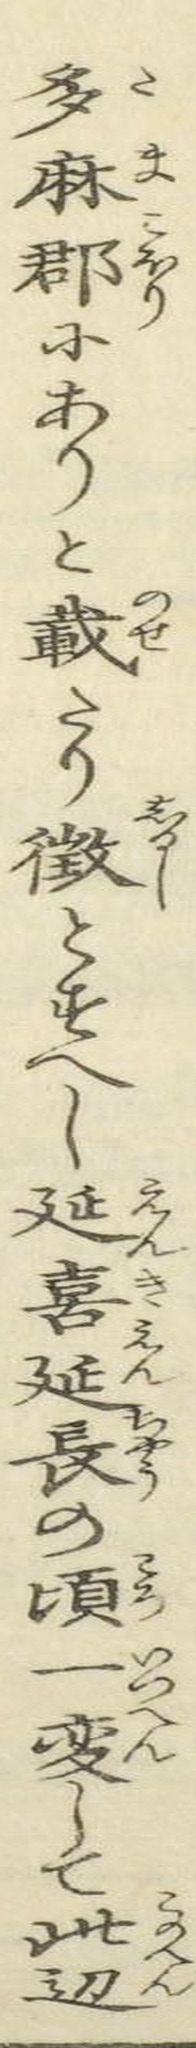多麻郡にありと載たり徴とすへし延喜延長の頃一変して此辺
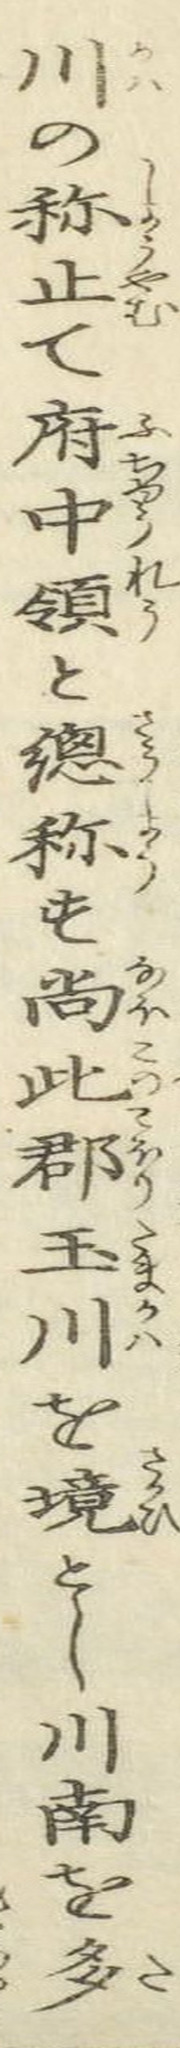川の称止て府中領と総称す尚此郡玉川を境とし川南を多
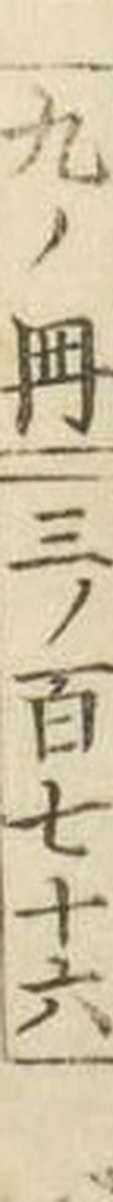九ノ冊三ノ百七十六
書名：江戸名所図会 20巻 巻之9
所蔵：東京学芸大学教育コンテンツアーカイブ
